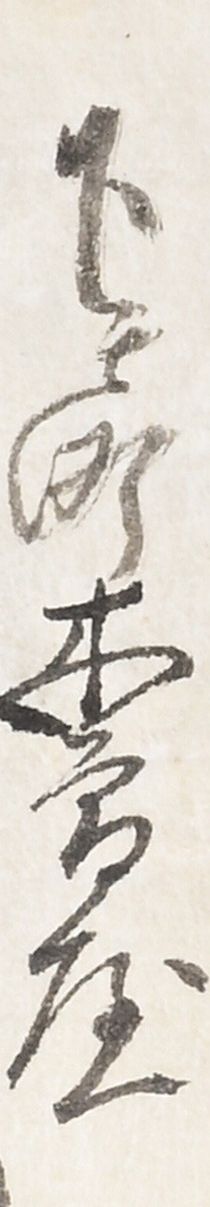下モ町木曽屋
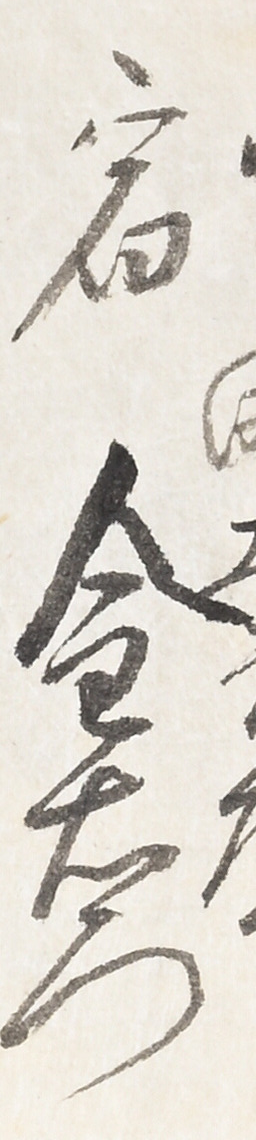宿金右衛門
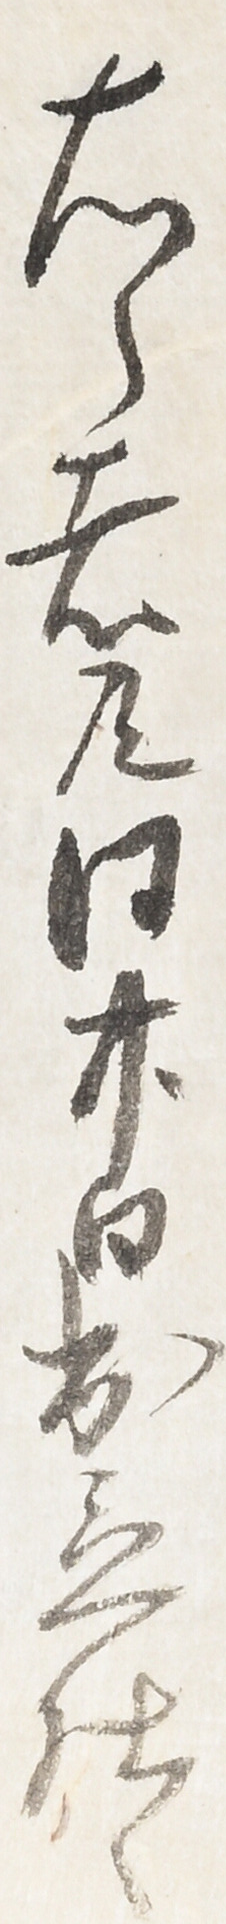右之者共同廿日出立仕候
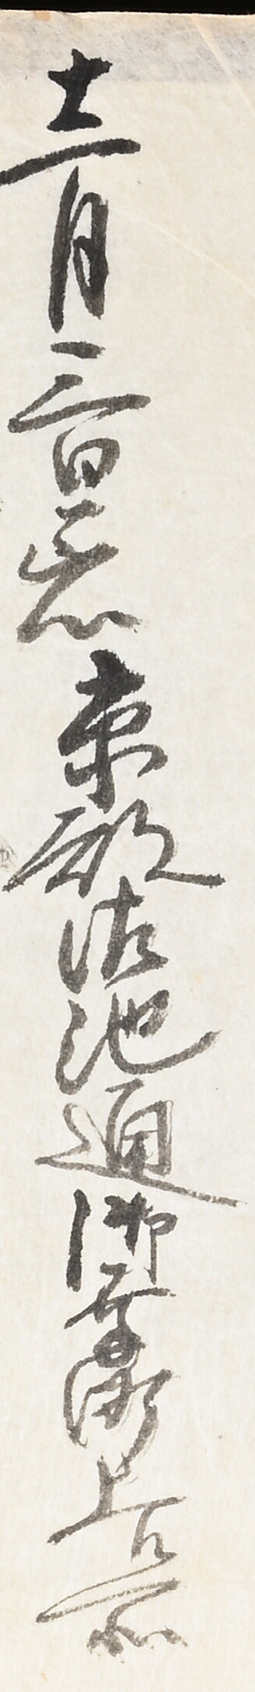十二月三日着京都御池通御幸町上ル所
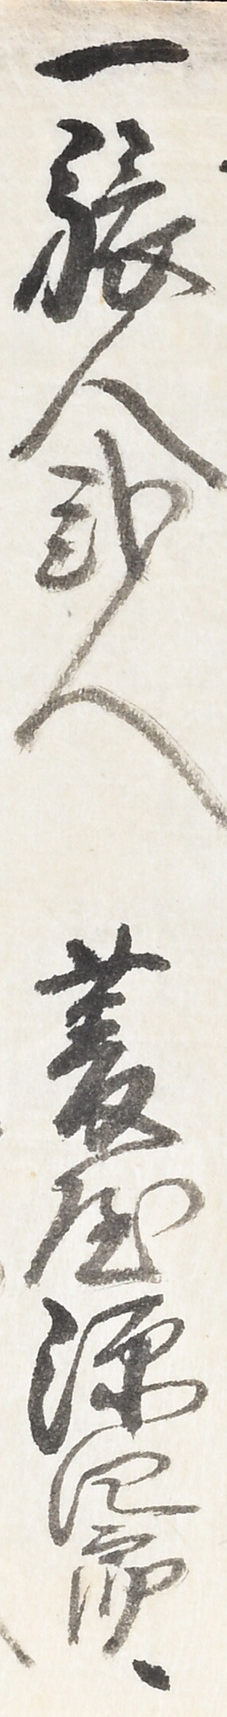一旅人弐人菱屋源四郎・
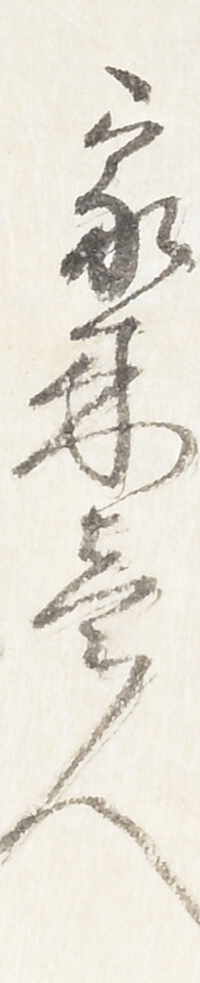家来壱人
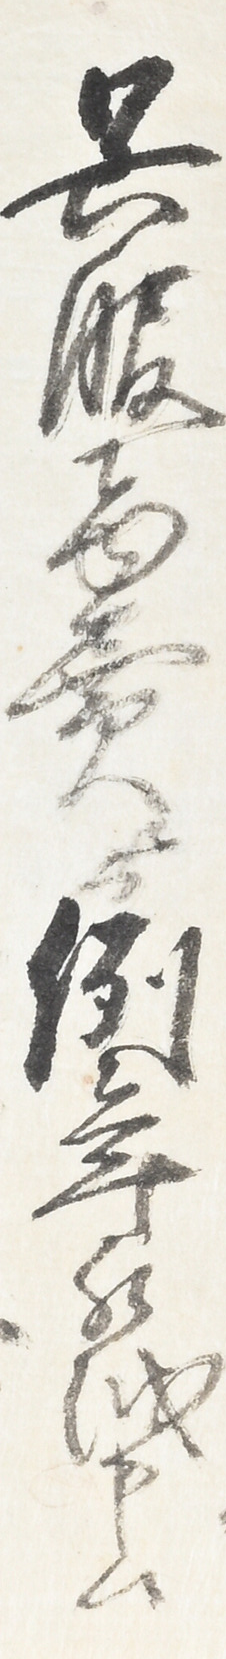呉服商売ニ而例年罷越申候
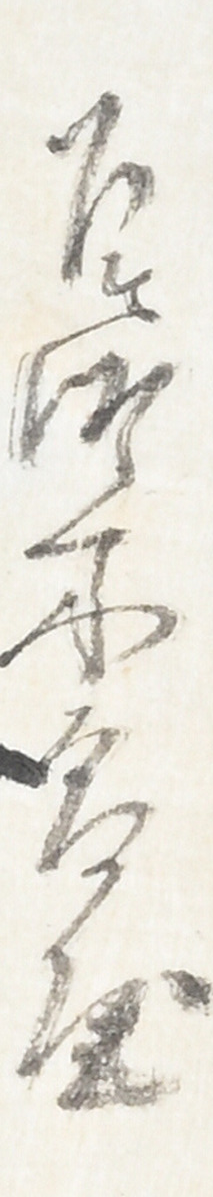下モ町木曽屋
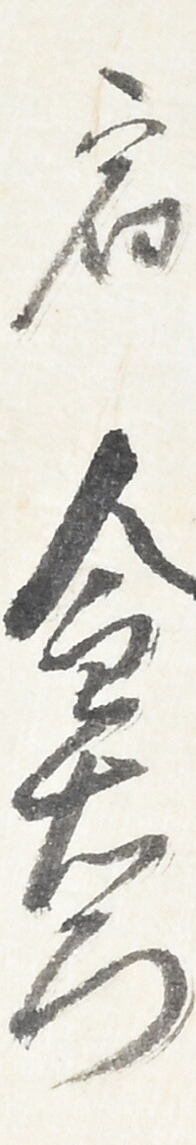宿金右衛門
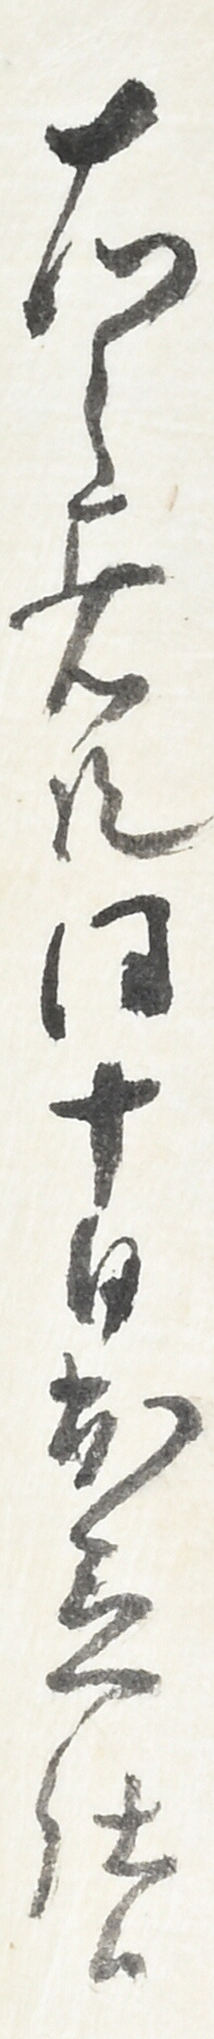右之者共同十日出立仕候
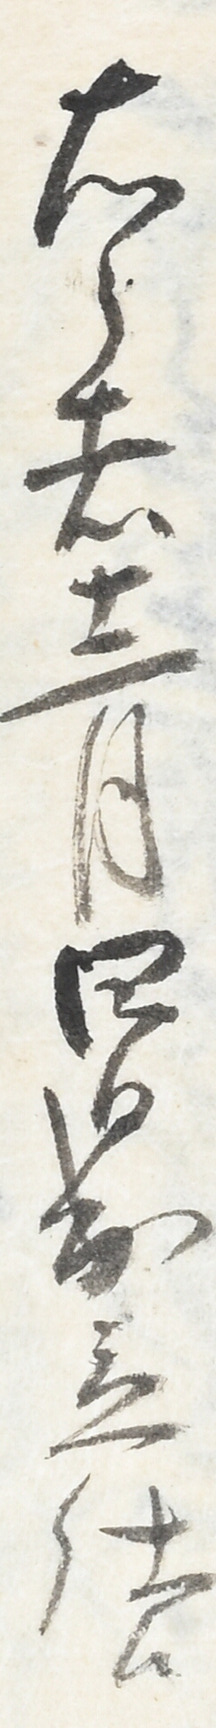右之者同六日出立仕候

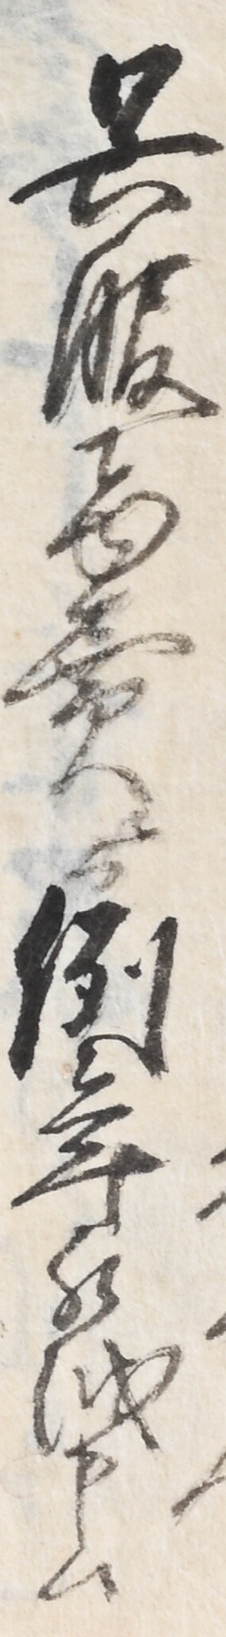油商売ニ而例年罷越申候
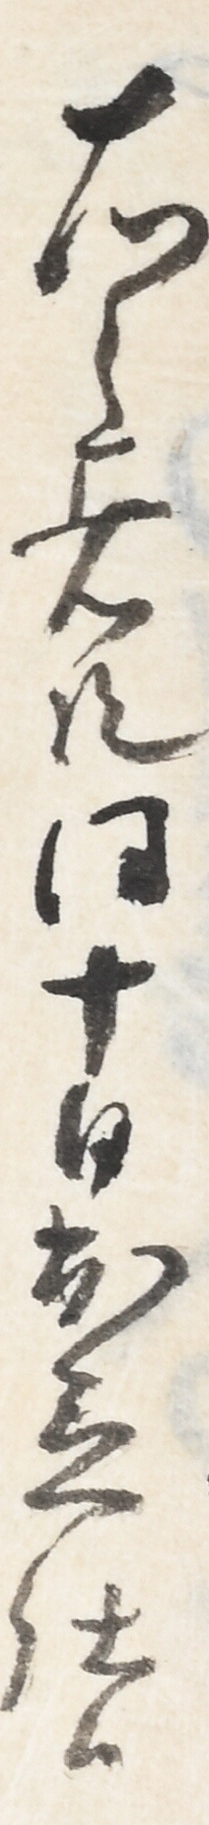右之者共同八日出立仕候
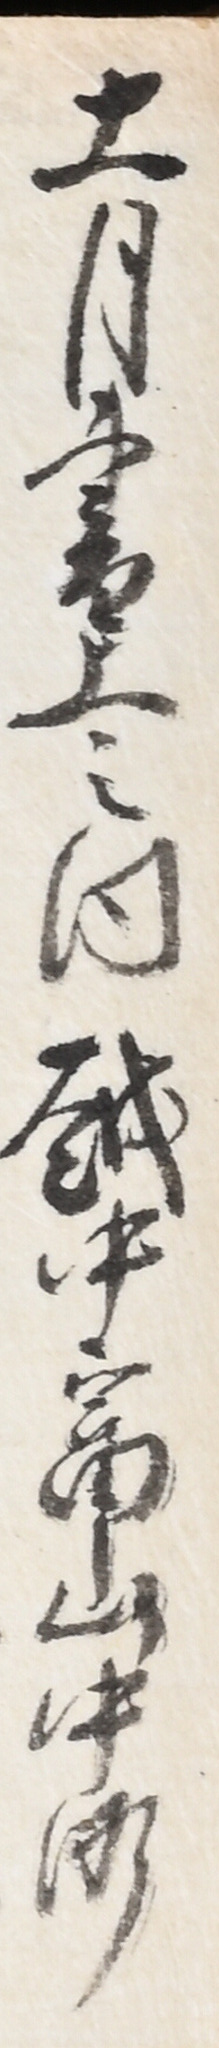十一月書上之内越中富山中町
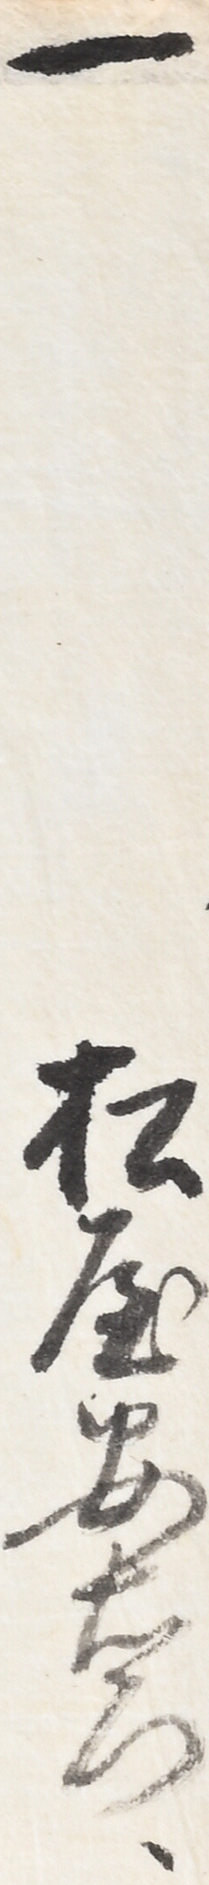一松屋安右衛門・
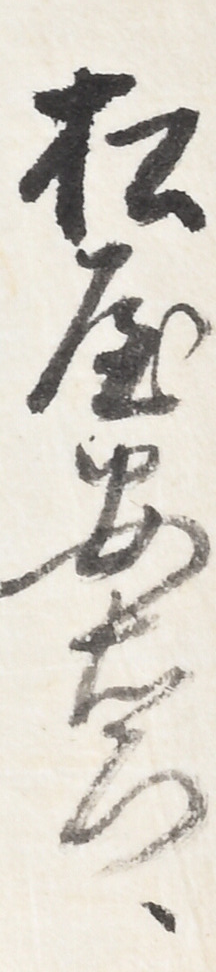一松屋安右衛門・
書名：旅人泊控帳
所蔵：伊那市立高遠町図書館・合同会社AMANE
